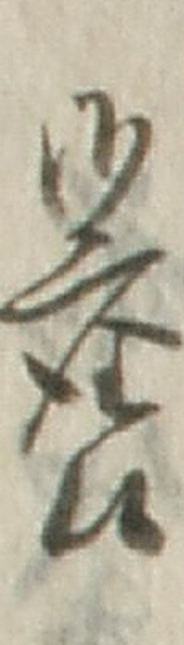御座候
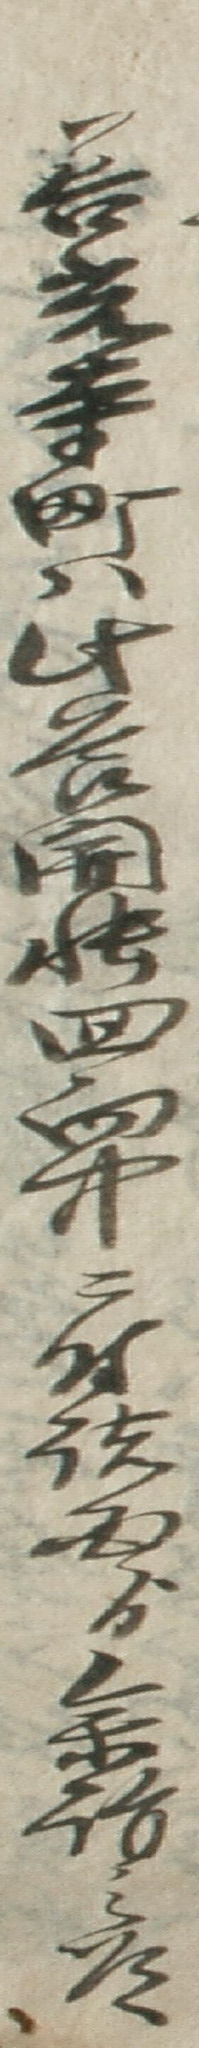一善光寺町ハ此節開帳回向中二付諸国ゟ参詣御座候
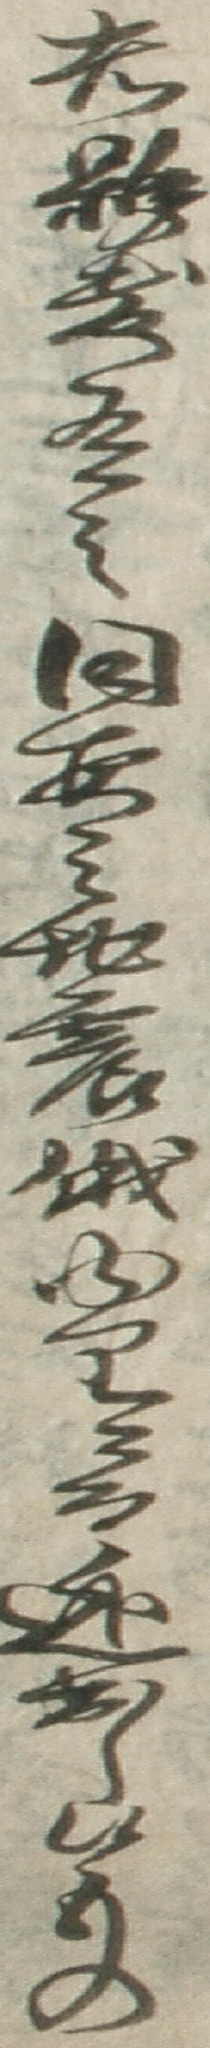者夥敷有之同夜之地震俄ゆり二而逃出し候もの
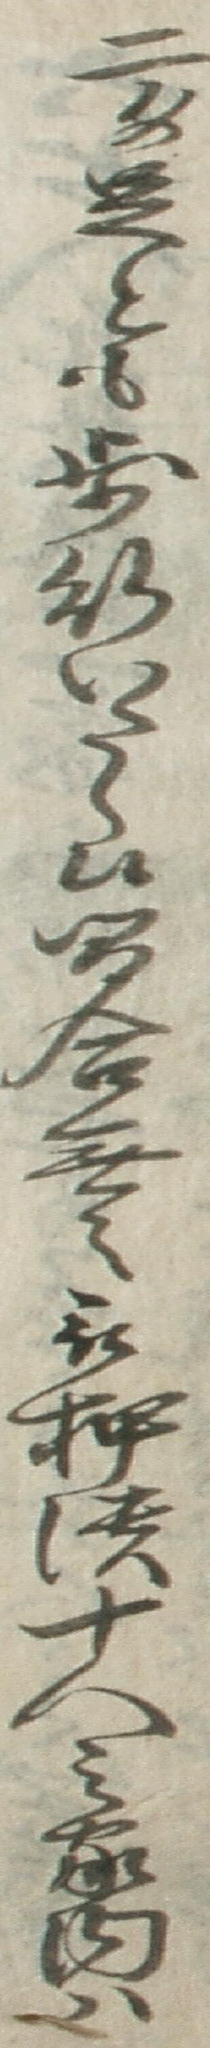二タ足とも歩行いたし候間合無之被押潰十人之家内ハ

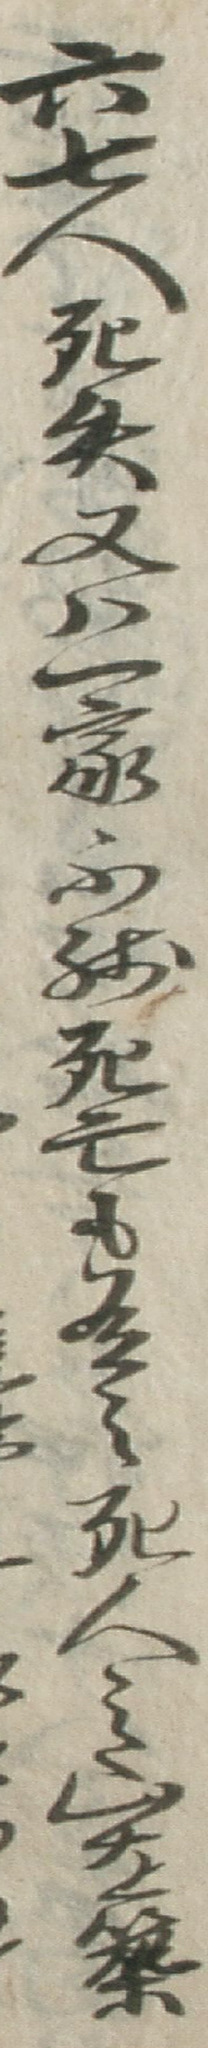六七人死失又ハ一家不残死亡も有之死人之山を築
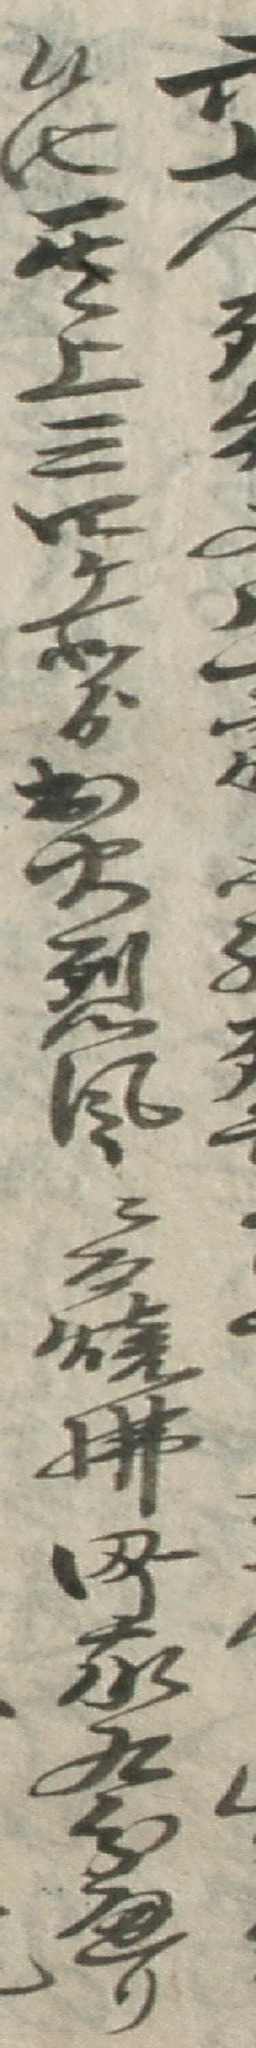候由其上三四ヶ所ゟ出火烈風二而焼払町家九分通り
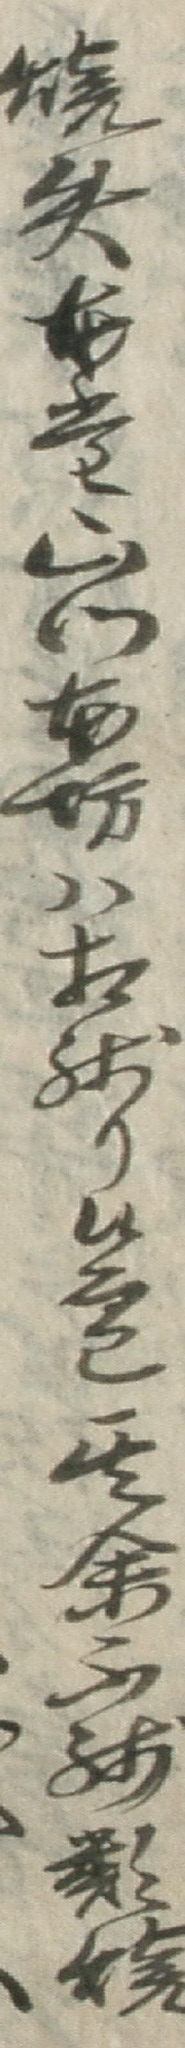焼失本堂山門本坊ハ相残り候而巳其余不残類焼
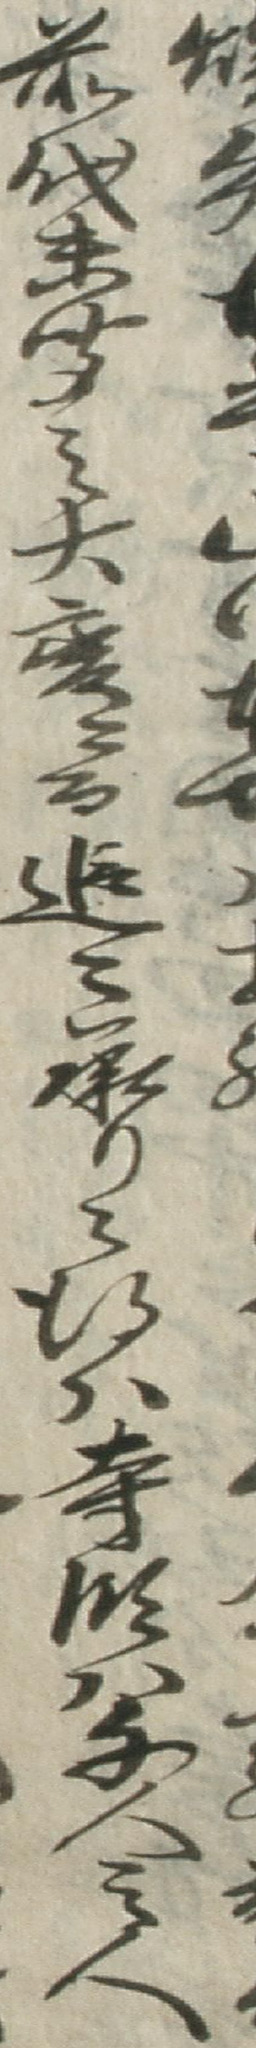前代未聞之大変二而追々承り候得ハ寺領ハ八千人之人
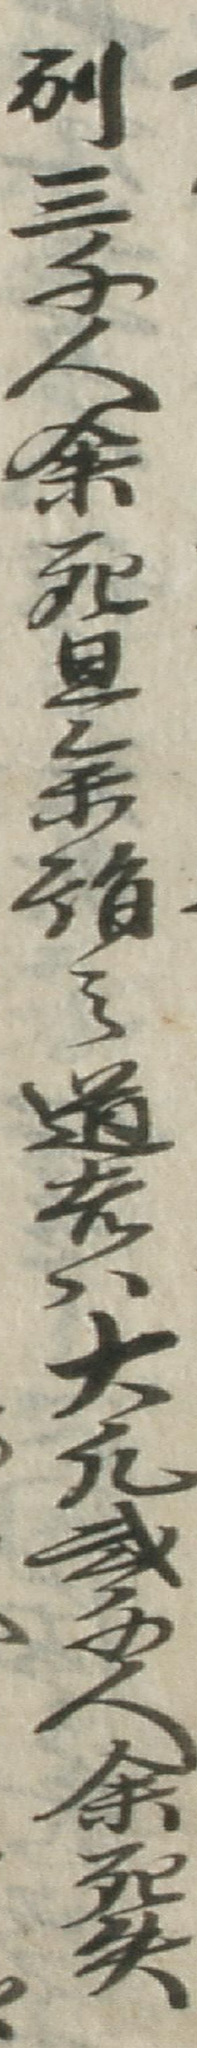別三千人余死且参詣之道者ハ大凡弐千人余死失
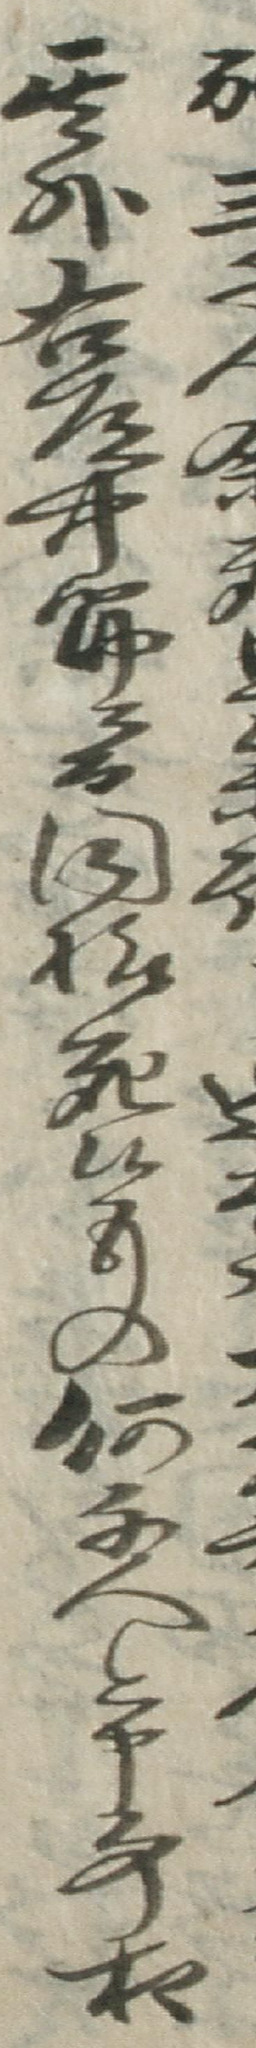其外右道中筋二而同様死候もの何千人と申事相
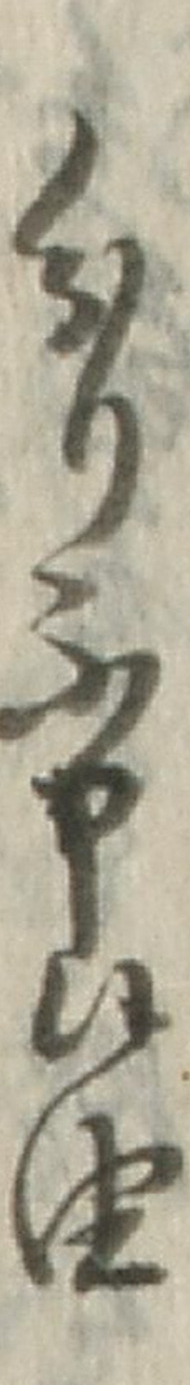分り不申候由
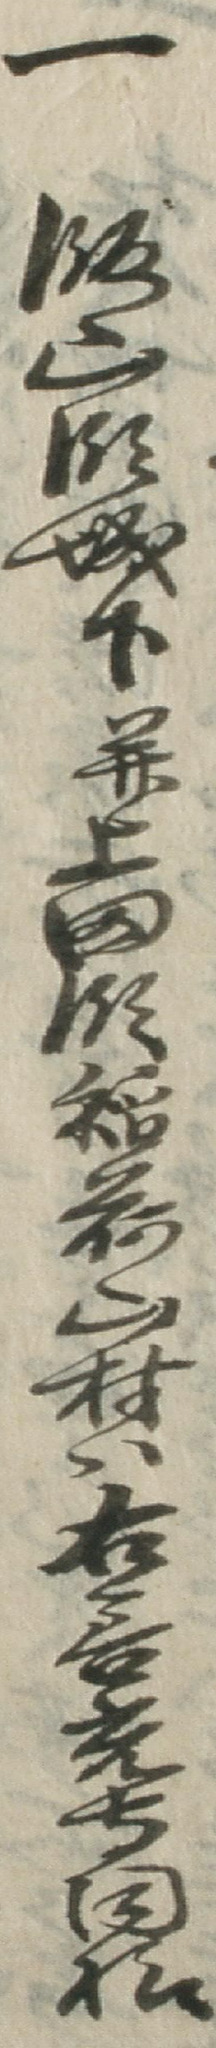一飯山領城下并上田領稲荷山村ハ右善光寺同様
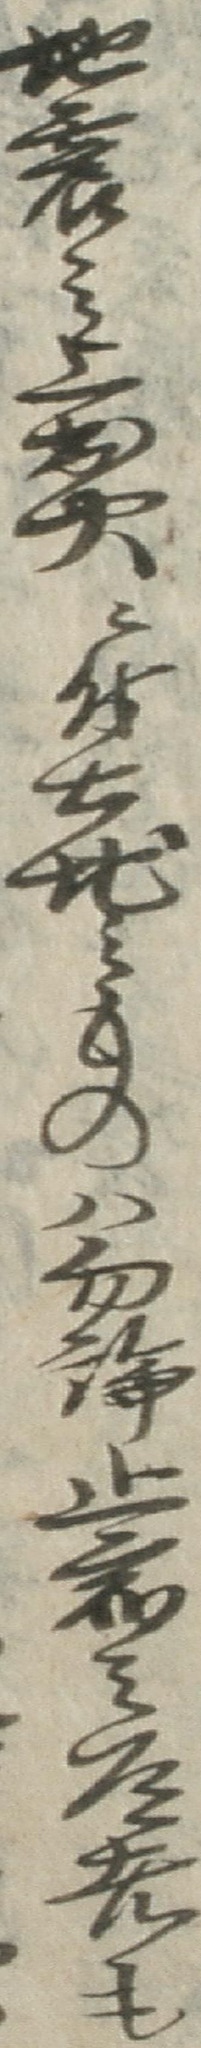地震之上出火二付土地之ものハ勿論止宿之道者も
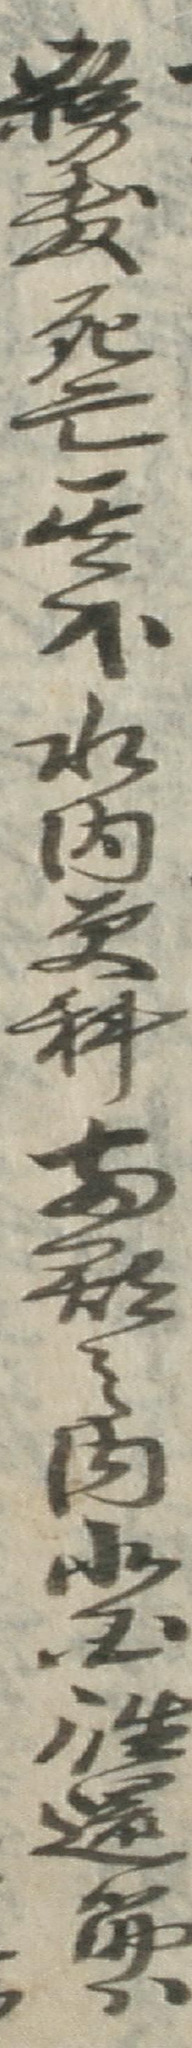夥敷死亡其外水内更級両郡之内北国往還筋ハ
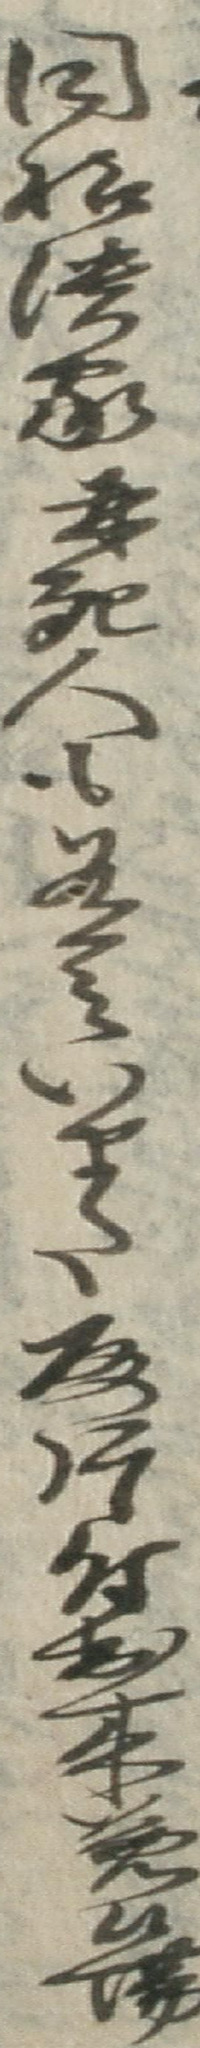同様潰家并死人も有之いまた取片付出来兼候場
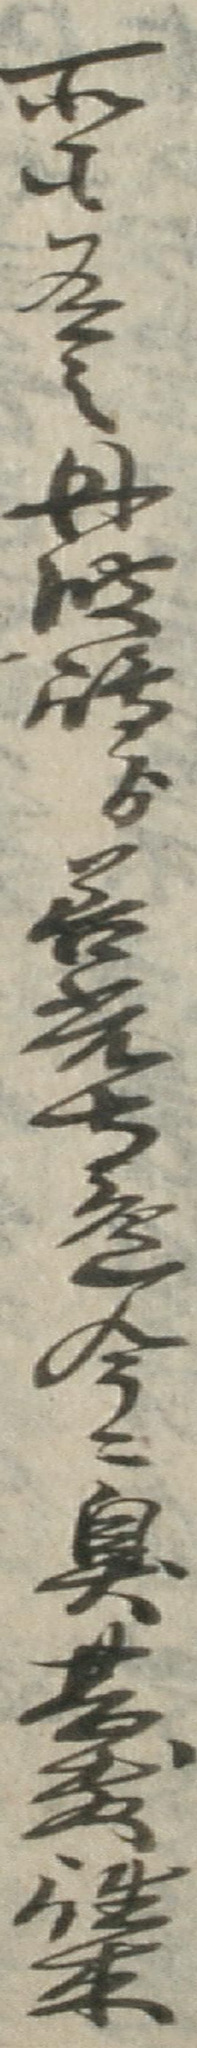所も有之丹波嶋ゟ善光寺辺今二臭甚敷往来
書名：信濃國地震實録記
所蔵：東京大学地震研究所図書室 Earthquake Research Institute Library, The University of Tokyo, JAPAN
